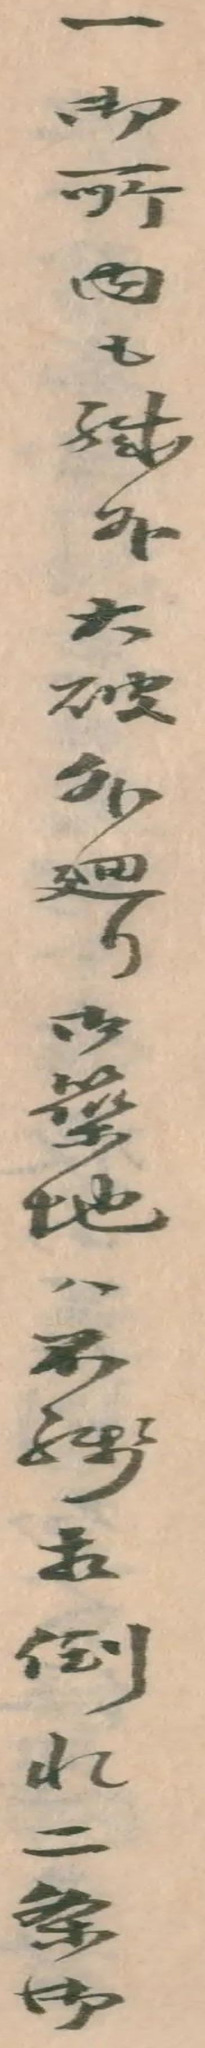一御所内も殊外大破外廻り御築地ハ不残倒れ二条御
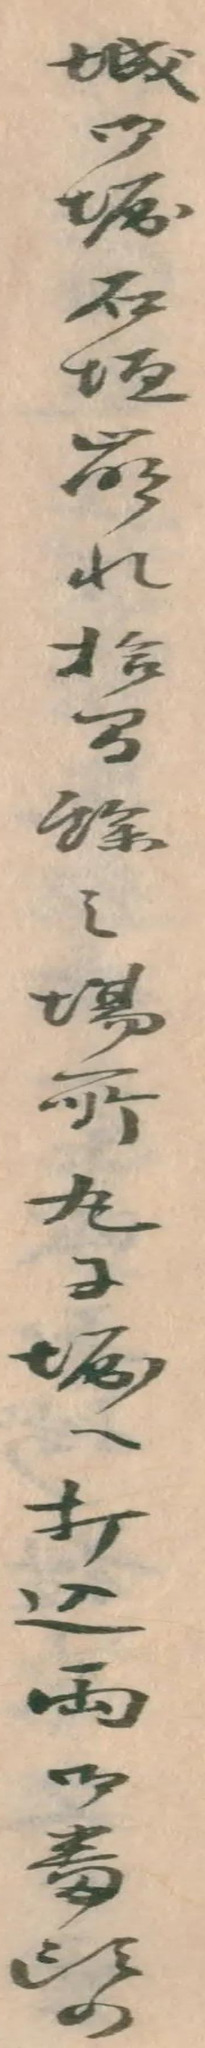城御堀石垣崩れ拾間余之場所共に堀へ打込両御番所の
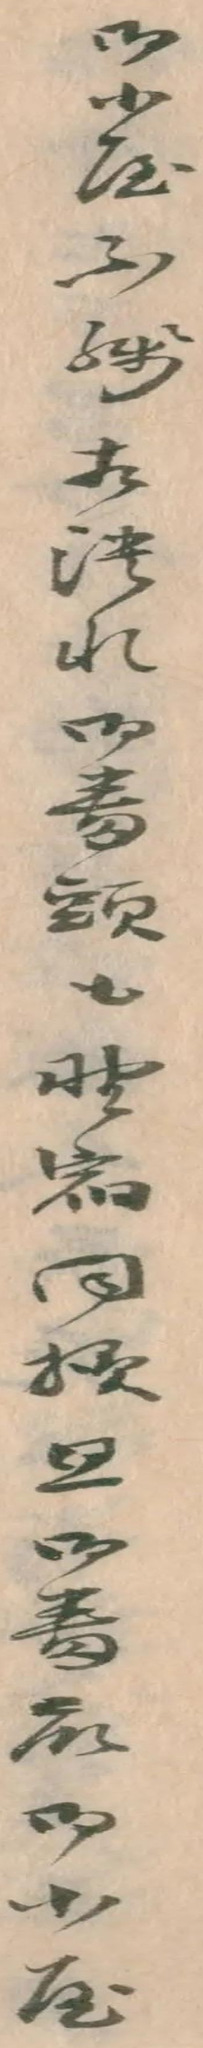御小屋不残相潰れ御番頭も野宿同様且御番衆御小屋
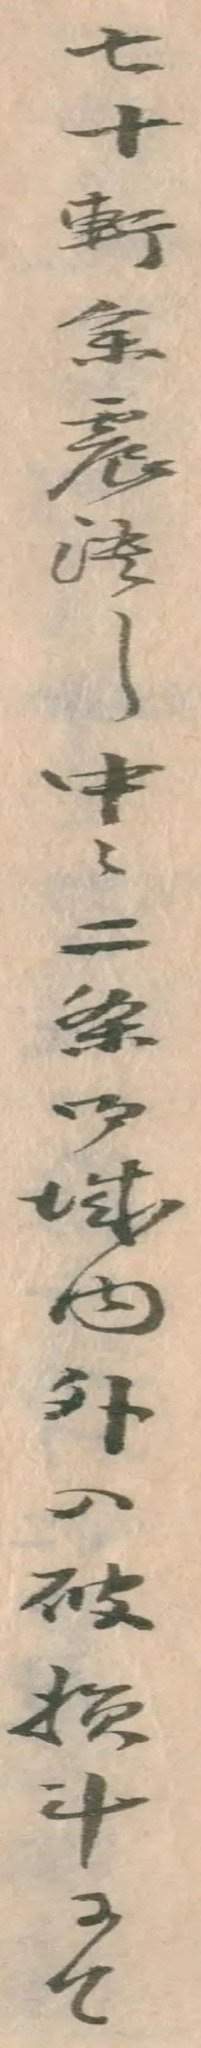七十軒余震潰し中二二条御城内外の破損斗にて
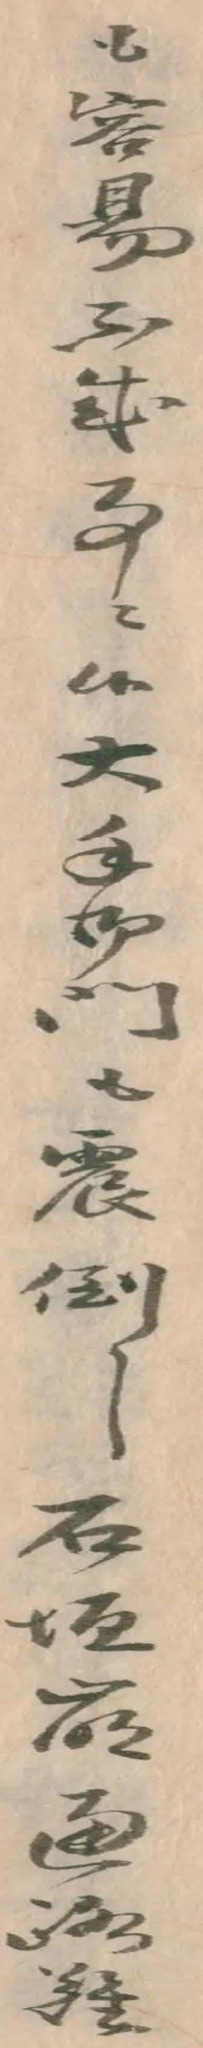も容易不成事二候大手御門も震倒し石垣崩通路難
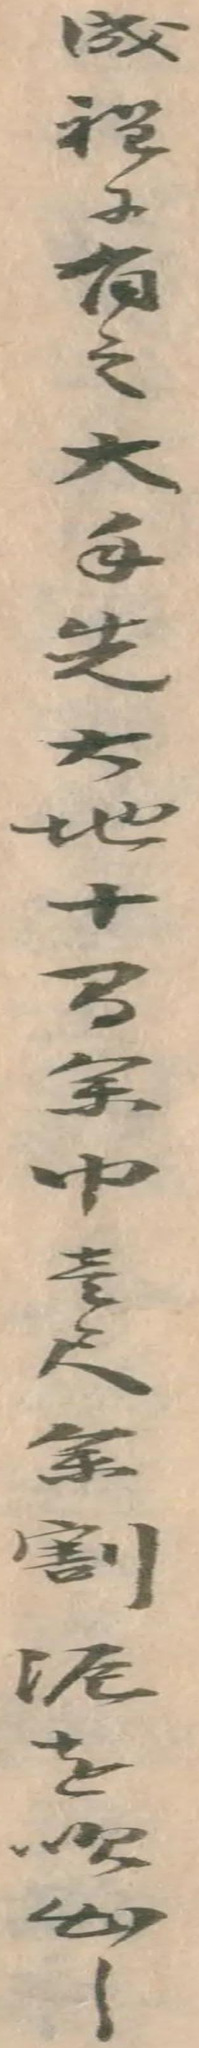成程に有之大手先大地十尺余巾壱尺余割泥を吹出し

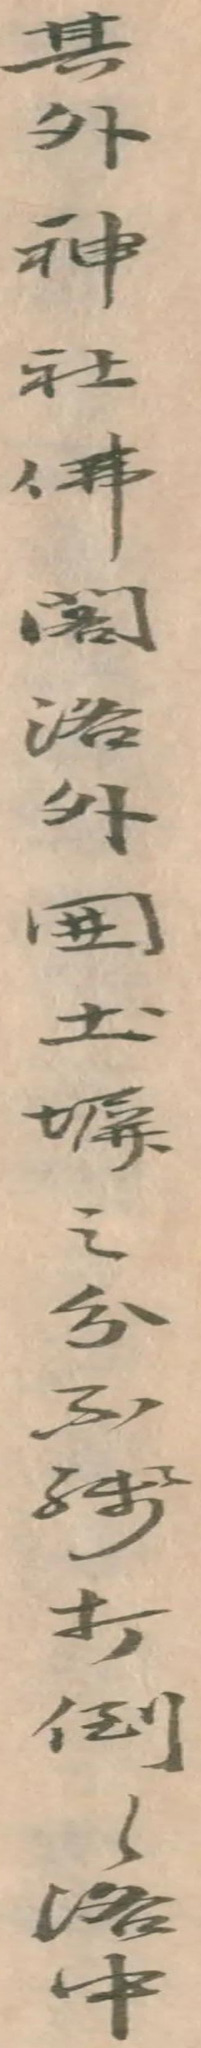其外神社仏閣洛外囲土塀之分不残打倒し洛中
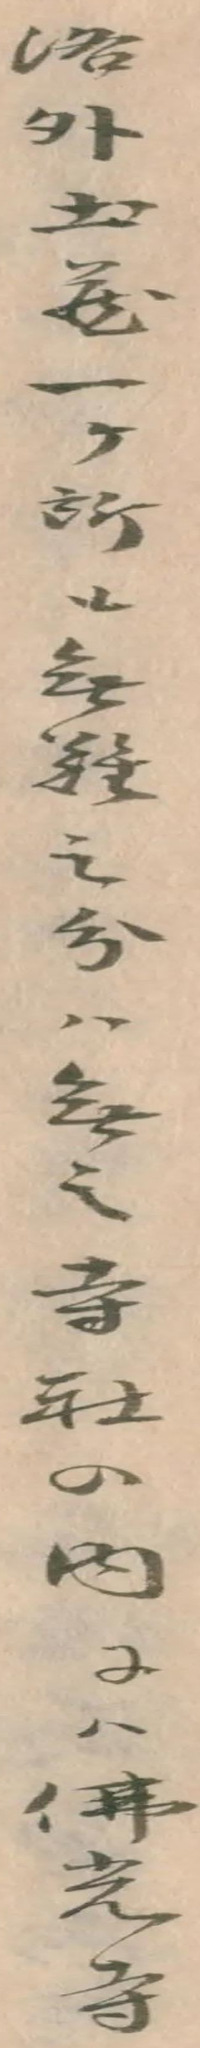洛外土蔵一ヶ所も無難之分ハ無之寺社の内にハ仏光寺
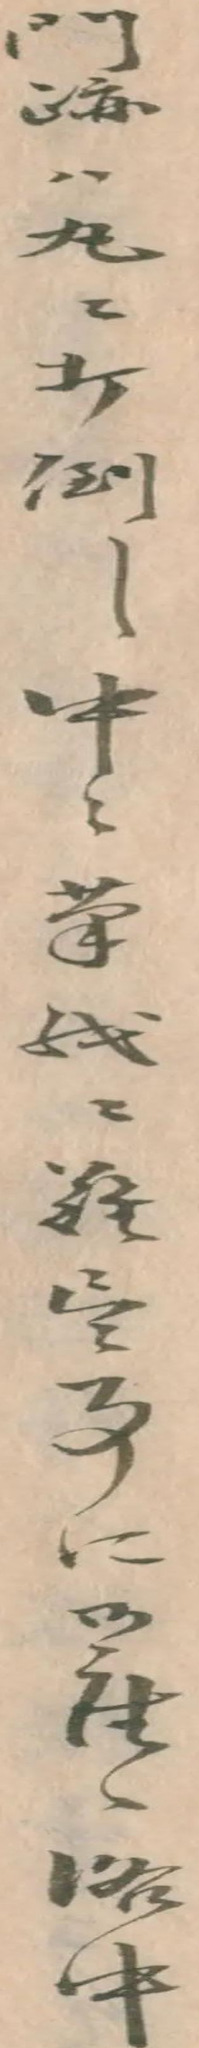門跡ハ丸々打倒し中々筆紙二難尽事に御座候洛中
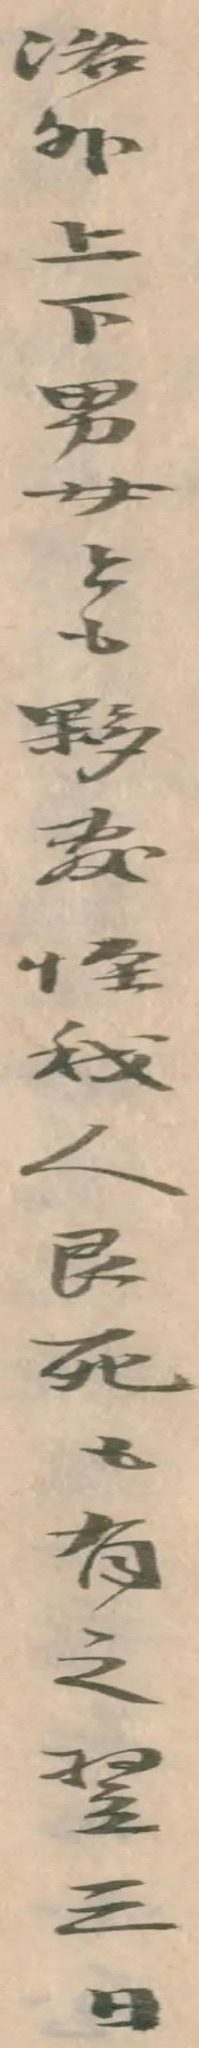洛外上下男女とも夥敷怪我人即死も有之翌三日
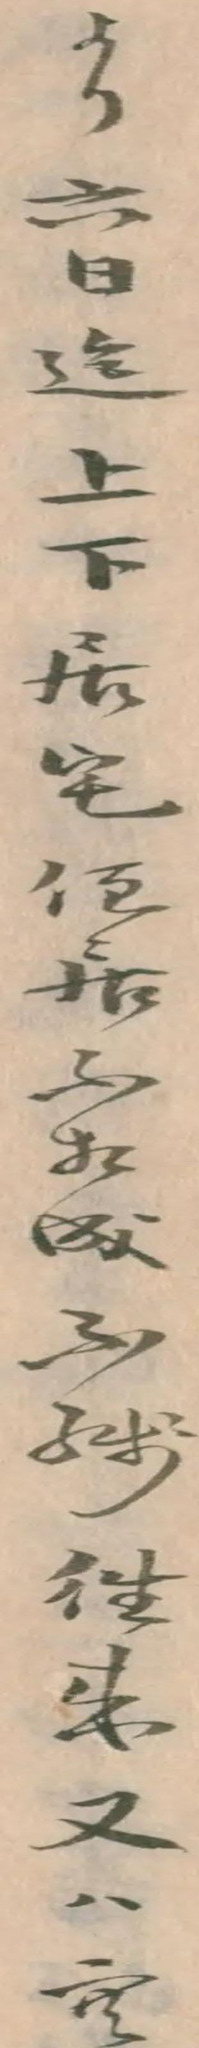より六日迄上下居宅住居不相成不残往来又ハ空
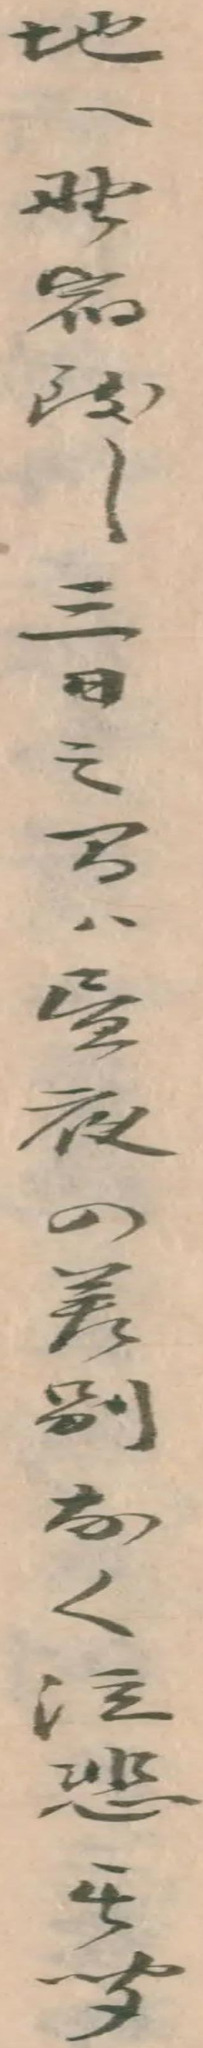地へ野宿致し三日之間ハ昼夜の差別なく泣悲其声
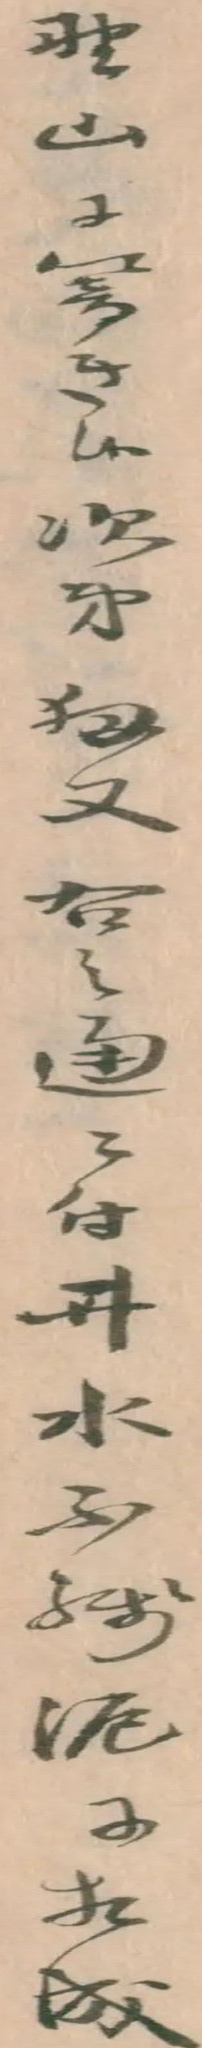野山に響き候次第猶又右之通二付井水不残泥に相成
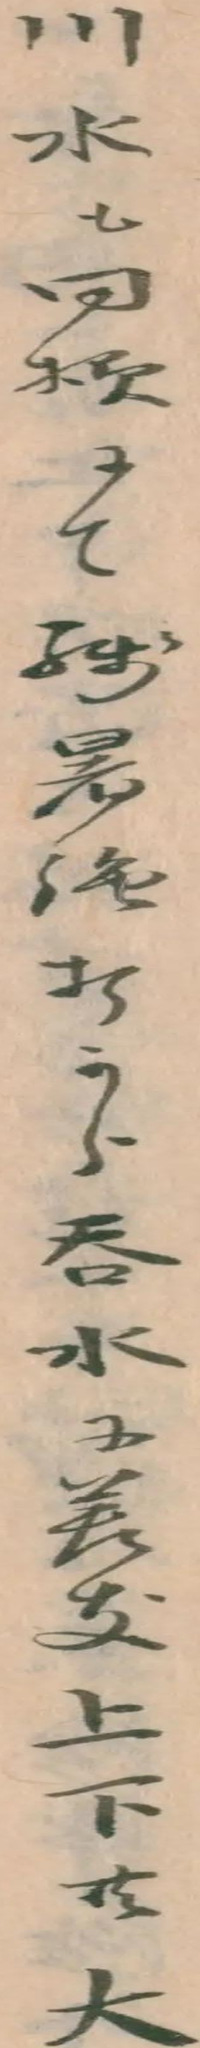川水も同様にて残暑強折から呑水に差支上下共大
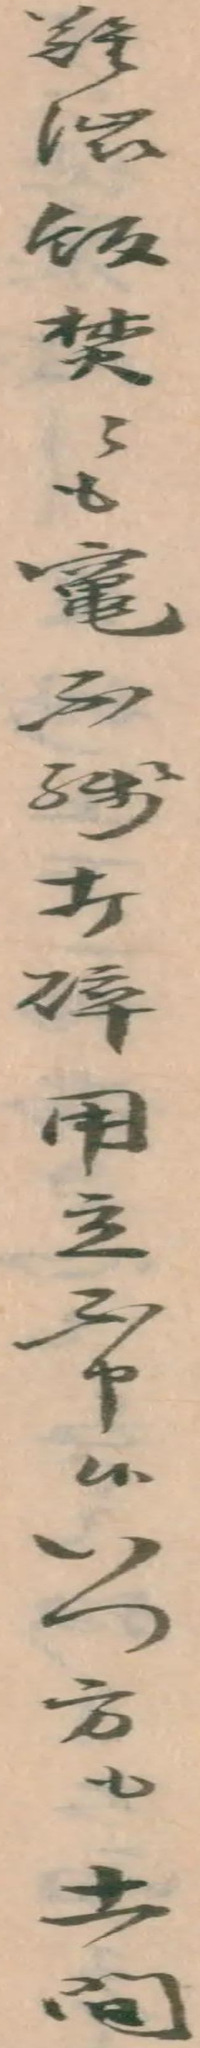難渋飯焚二も竈不残打砕用立不申候いつ方も土間
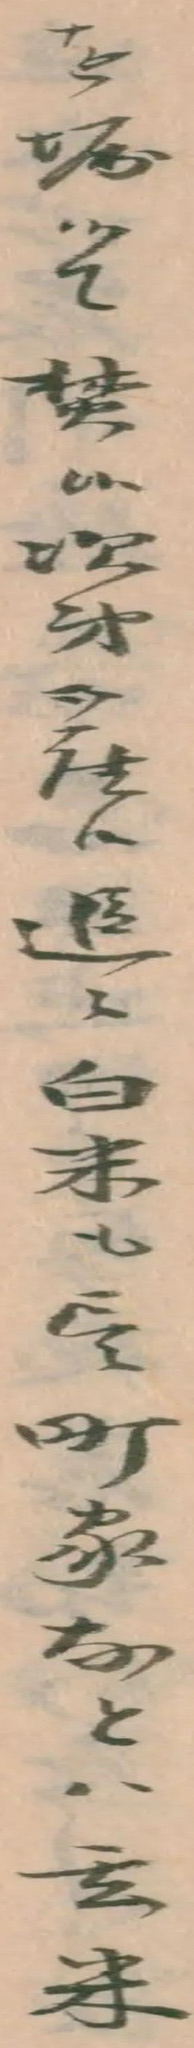を堀候て焚候次第御座候追々白米も尽町家なとハ玄米
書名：京都地震
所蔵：国立国会図書館 National Diet Library, JAPAN
